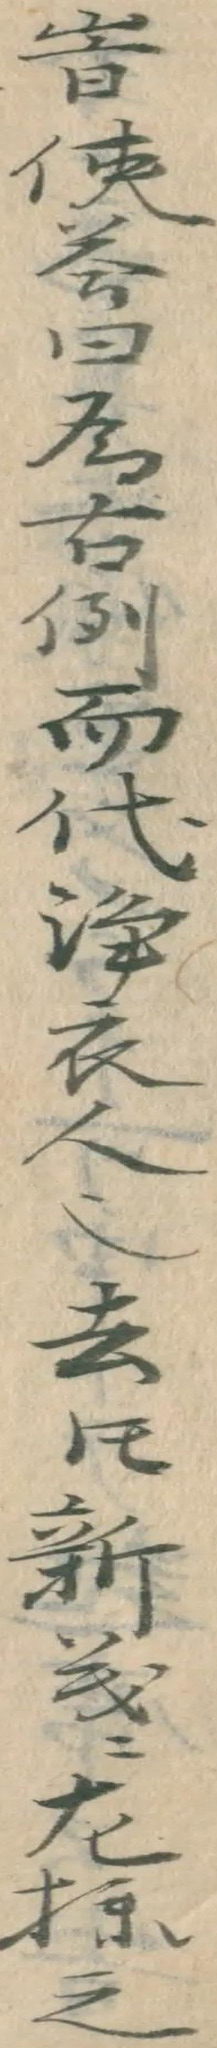旹使答曰為古例而代浄衣人也去トモ新義ニ左様之

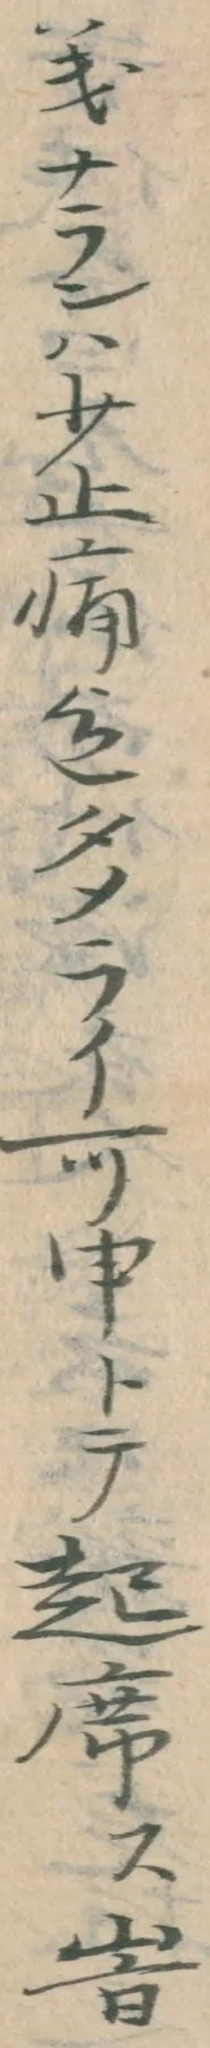義ナランハ少止痛迄タメライ可申トテ起席ス旹
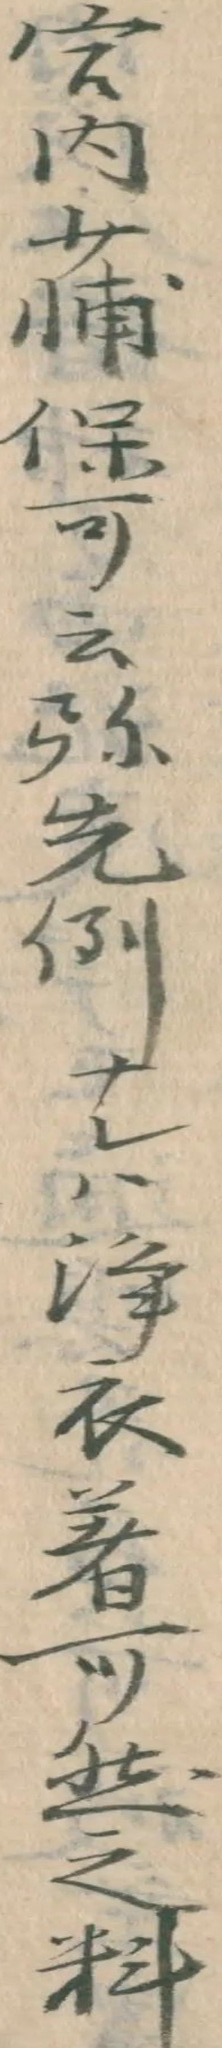宮内少輔保可云弥先例ナレハ浄衣着可然之料
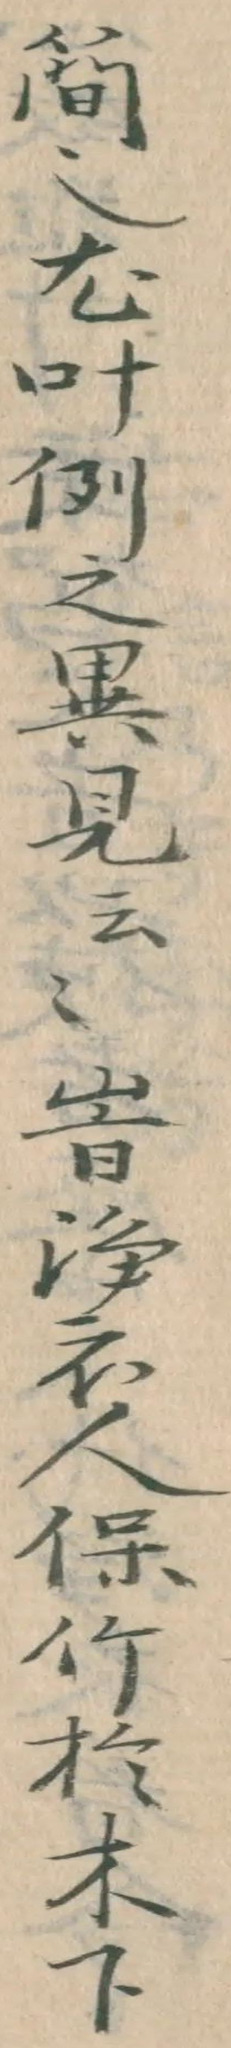簡也尤叶例之異見云々旹浄衣人保竹於木下
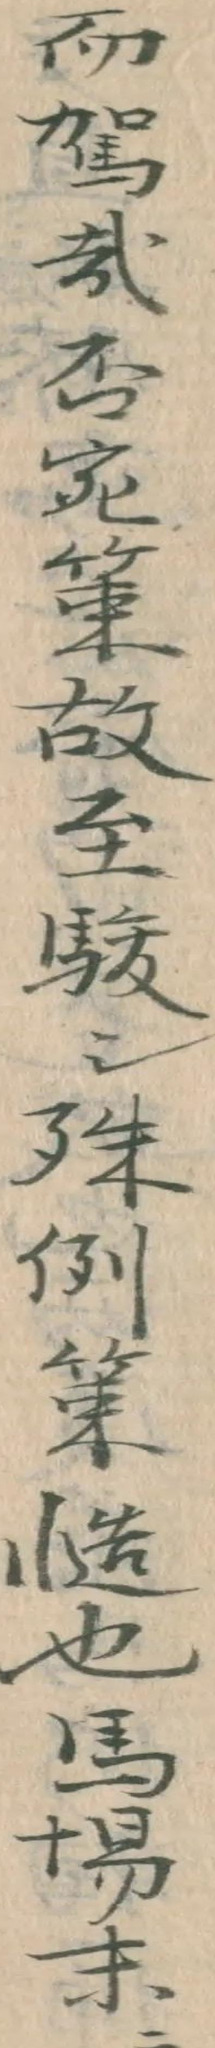而駕哉否宛策故至駿シ殊例策慥也馬場末ニ
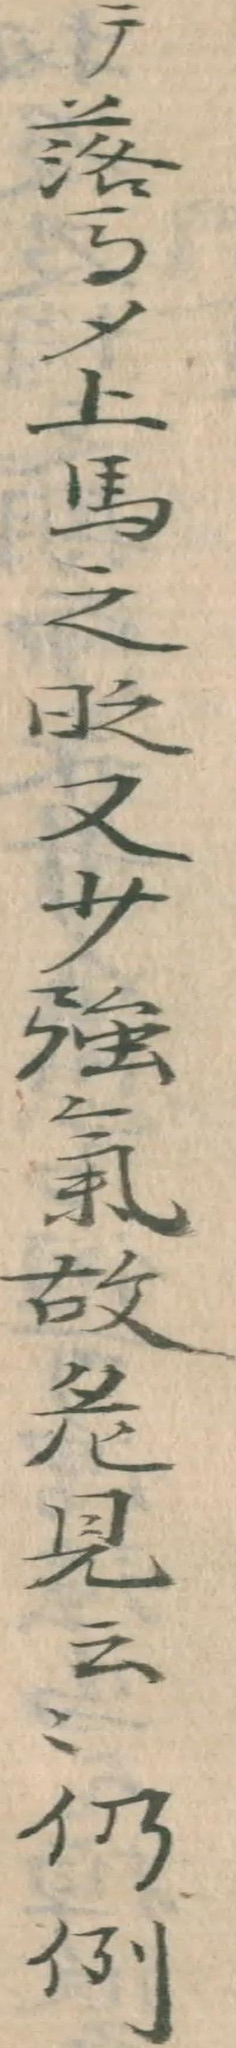テ落馬シテ上馬之眨又少強気故危見云々仍例
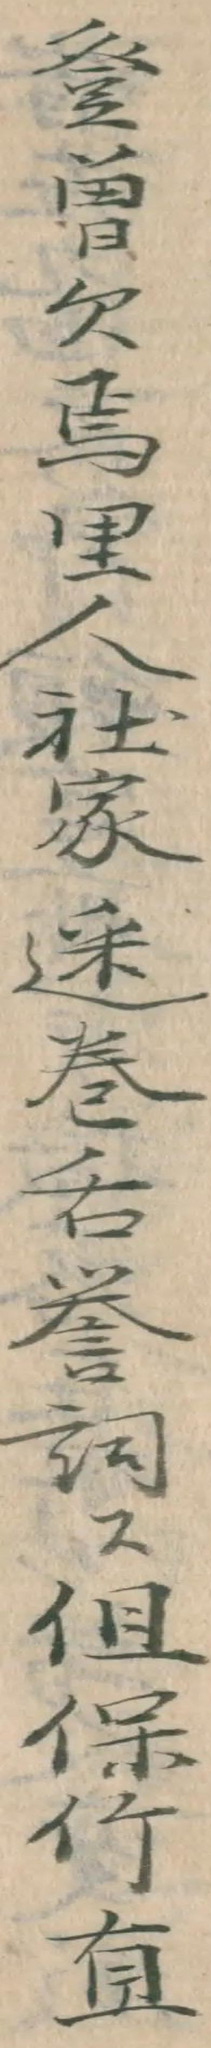登曽欠焉里人社家迷巻舌誉詞ス但保竹直
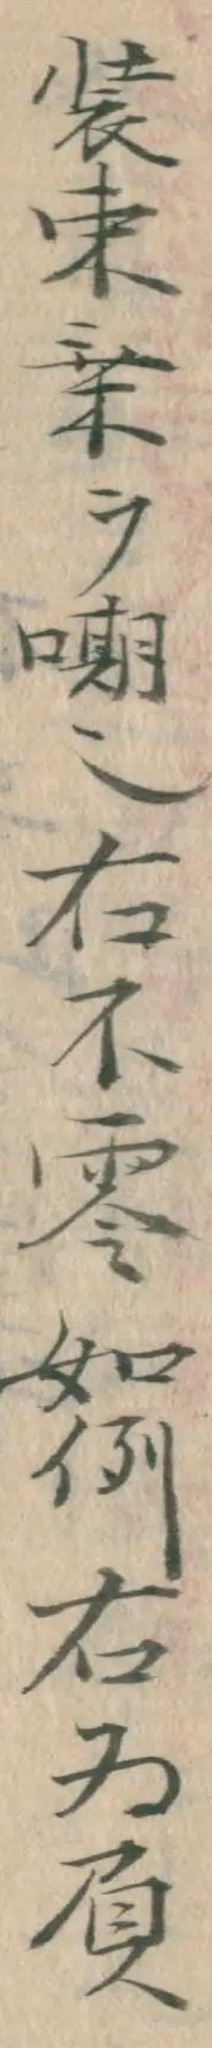装束乗ヲ嘯也右不零如例右為負
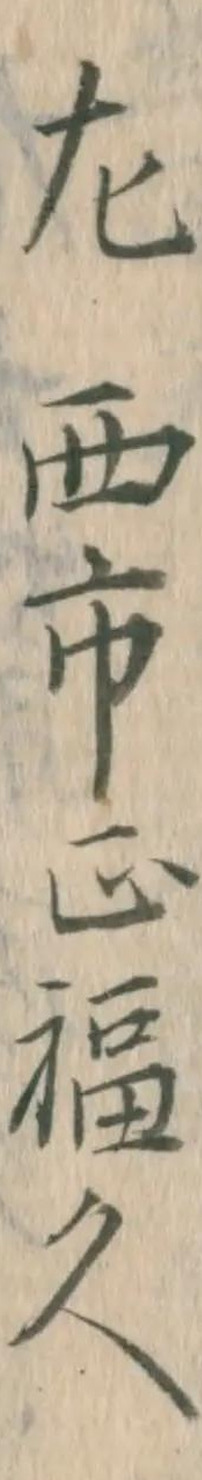左西市正福久
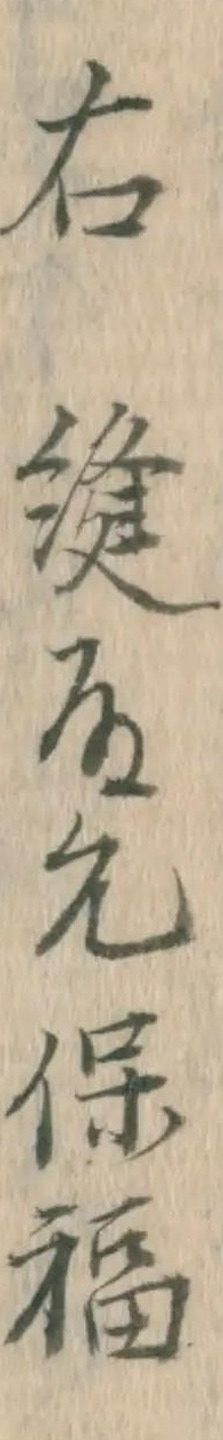右縫殿允保福
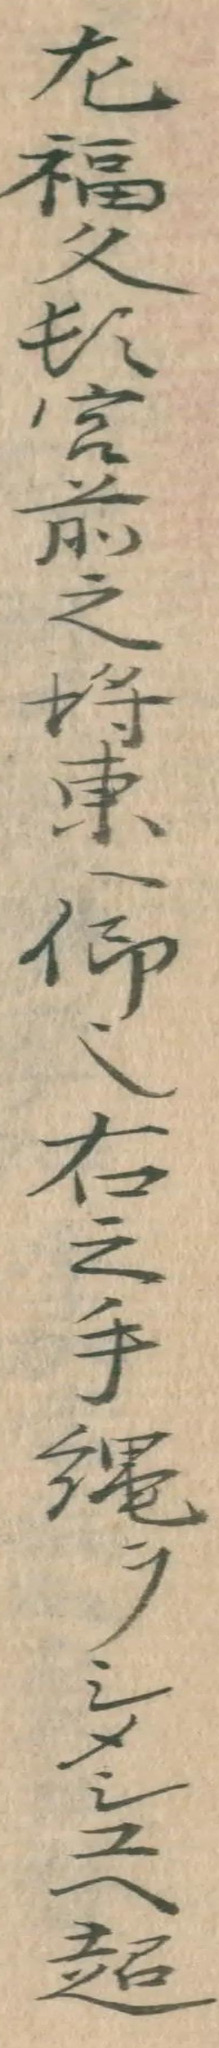左福久頓宮前之埒東へ仰也右之手縄ヲシメシユヘ超
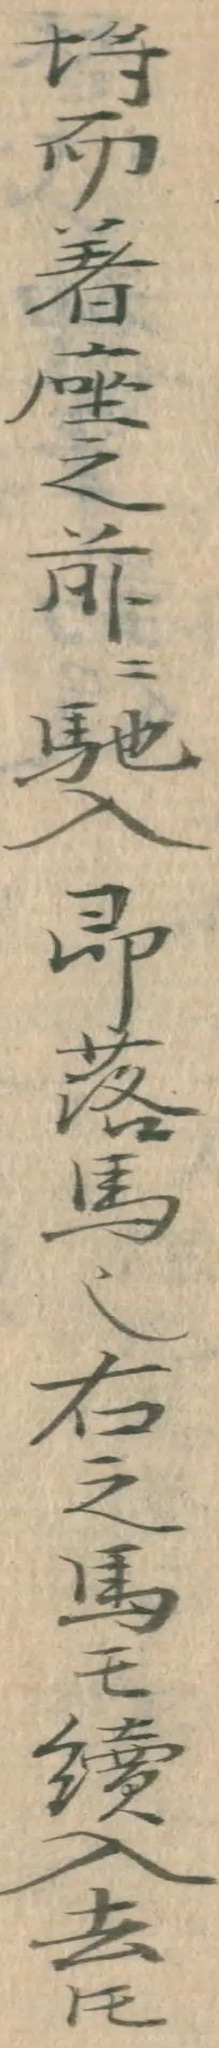埒而着座之前二馳入即落馬也右之馬モ続入去トモ
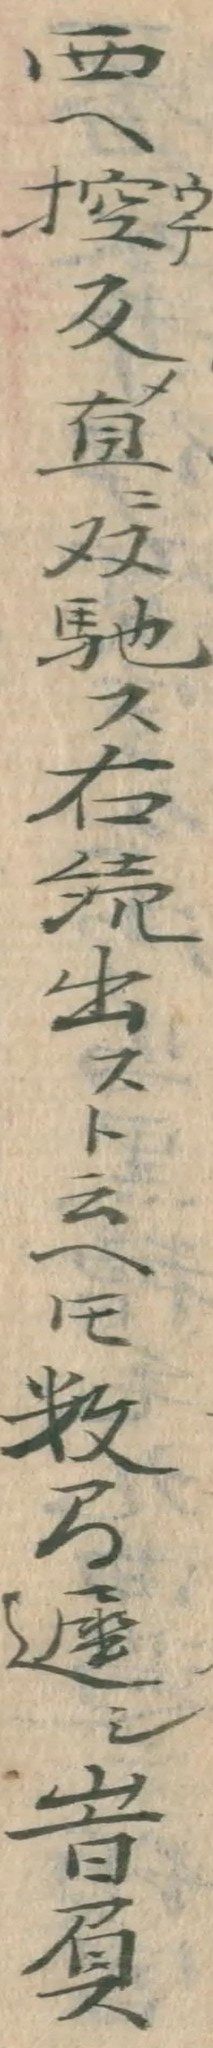西ヘ控反シテ直ニ双馳ス右続出スト云ヘトモ数間遅シ旹負
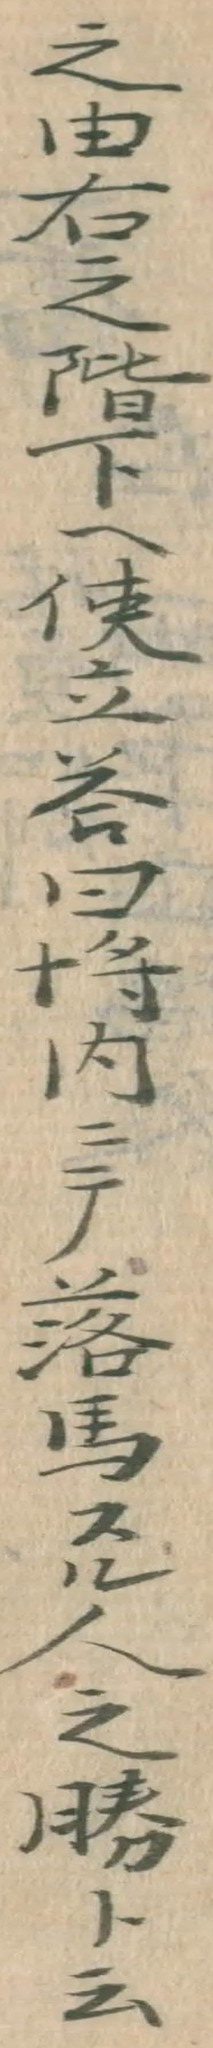之由右之階下へ使立答曰埒内ニテ落馬スル人之勝ト云
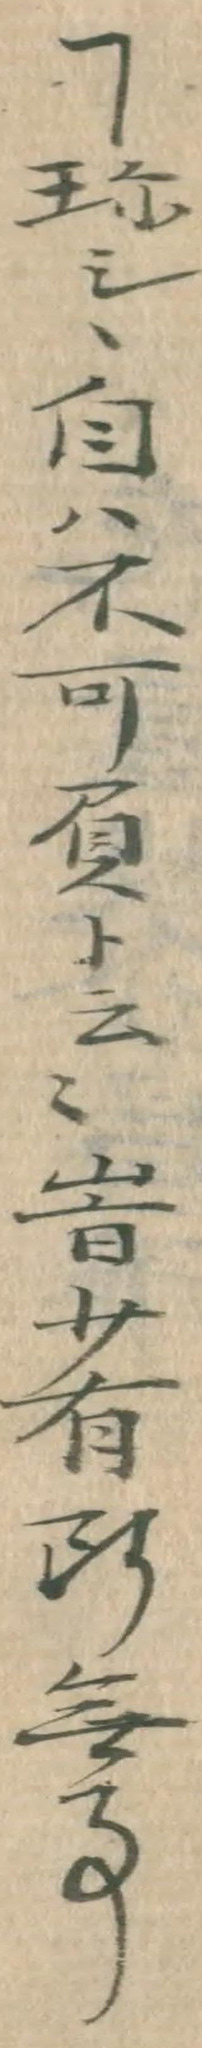コト珎シヽ自ハ不可負ト云々旹少有断無事
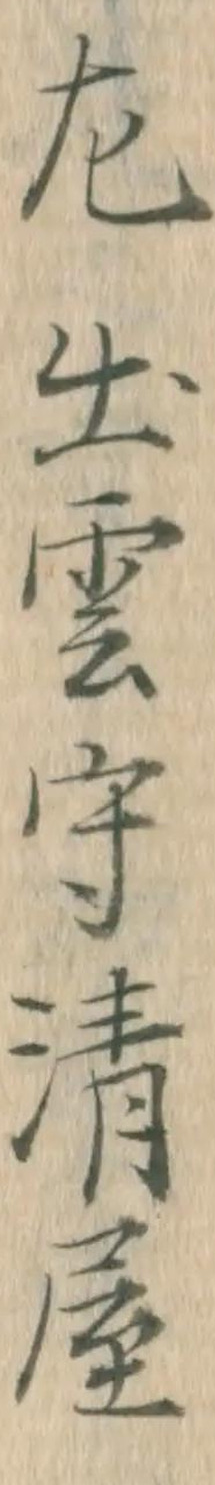左出雲守清屋
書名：賀茂社記録. 第10冊
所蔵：国立国会図書館 National Diet Library, JAPAN
